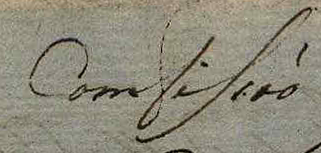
Comfissaõ
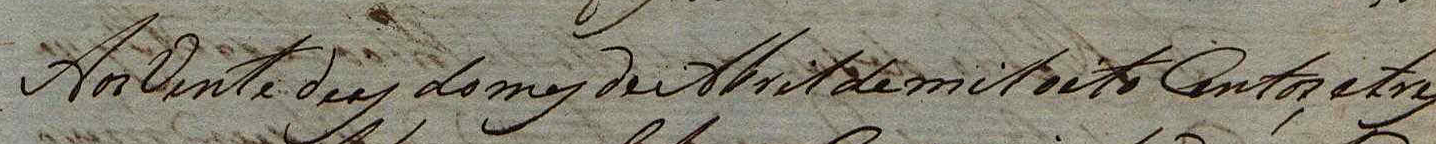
Aos Vinte dias do mes de Abrir de mil oitoCentos, e tres
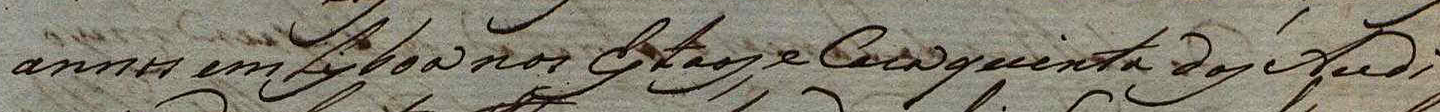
annos em Lisboa nos Estaos, e Caza quinta das Audi
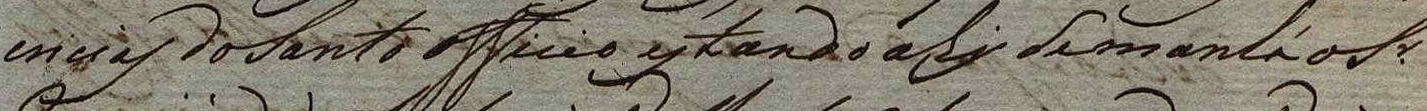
encias do Santo officio estando ahy de manha o Sr.
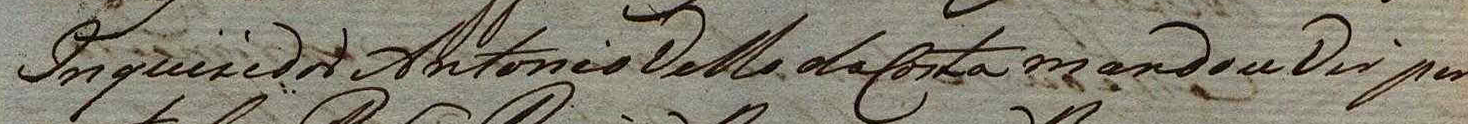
Inquizidor Antonio Velho da Costa mandou Vir per
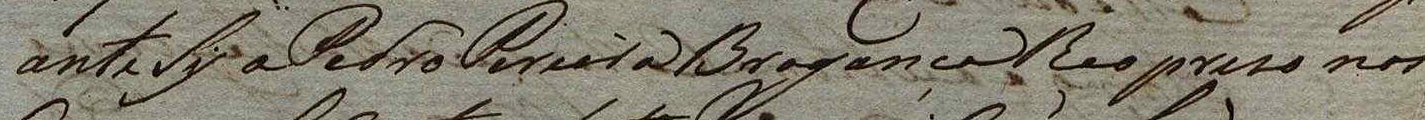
ante Sy a Pedro Pereira Bragança Reo prezo nos
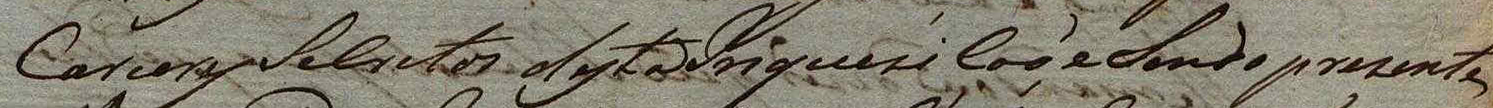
Carceres SeCretos desta Inquiziçaõ, e Sendo prezente
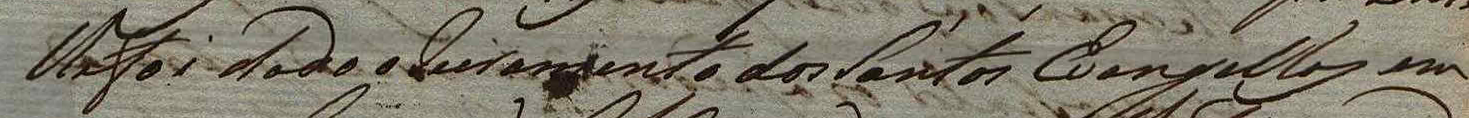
lhe foi dado o Iuramento dos Santos Evangelhos em
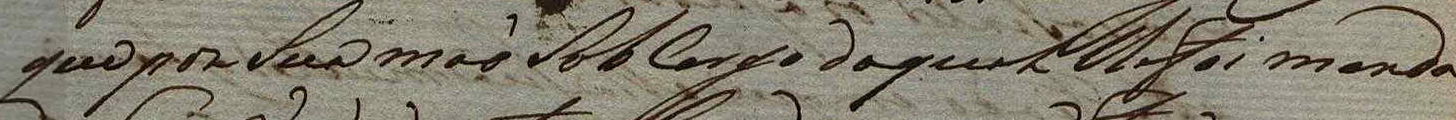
que poz Sua maõ Sob Cargo do qual lhe foi manda
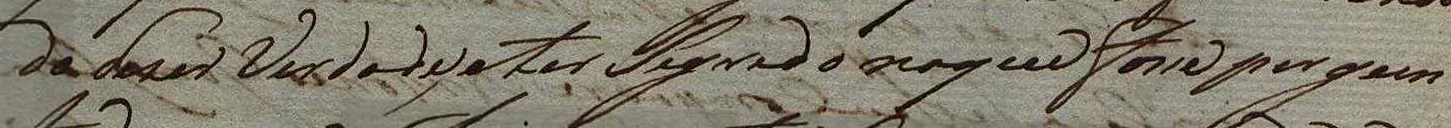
do dizer Verdade e ter Segredo no que fosse pergun
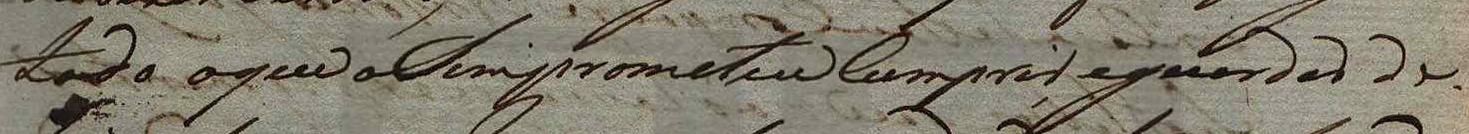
tado o que aSim prometeu Cumprir e guardar de
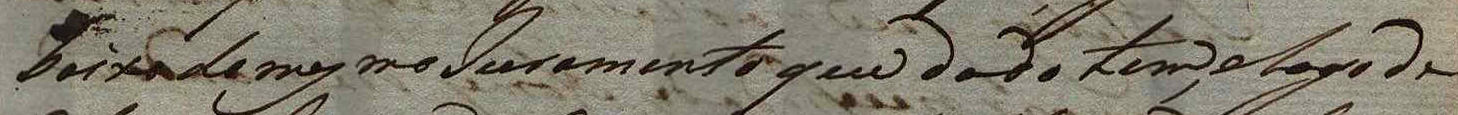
baixo do mesmo Iuramento que dado tem, e logo de
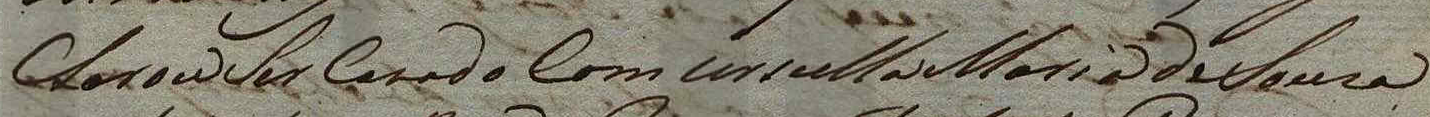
Clarou Ser Cazado Com ursulla Maria de Souza
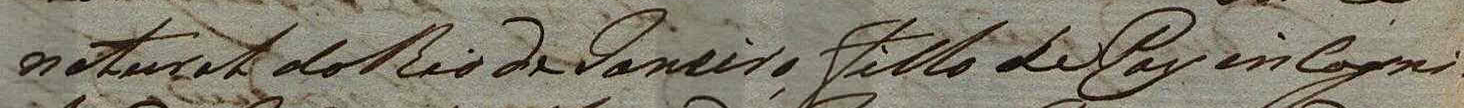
natural do Rio de Ianeiro, filho de Pay inCogni
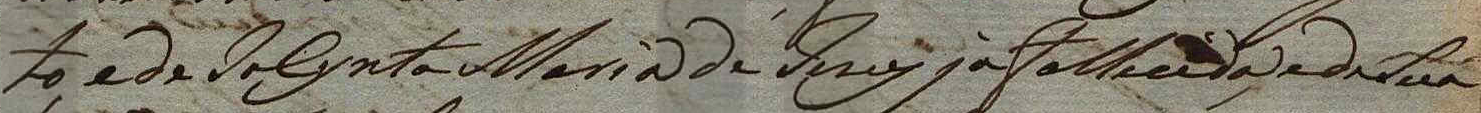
to e de IaCynta Maria de Iezus jà fallecida, e da Sua
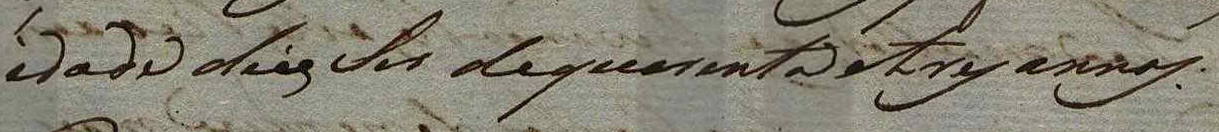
idade dice Ser de quarenta e tres annos.
